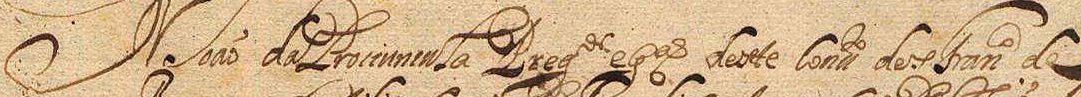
Fr Ioaõ da Prociuncula Preg.or e Gaõ deste Conuto de s Franco de
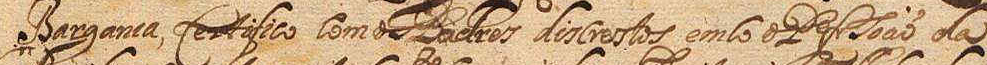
Bargança, Certifico com os Padres discrestos em lo o Pe fr. Ioaõ da
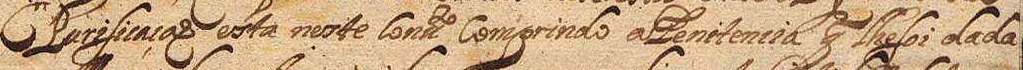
Purificaçaõ esta neste Conuto comprindo a Penitencia q̄ lhe foi dada
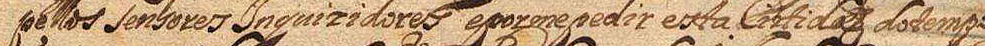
pellos senhores Inquizidores e por me pedir esta Certidaõ do tempo
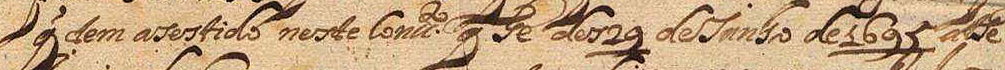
q̄ tem asestido neste Conu.to q̄ he de 29 de Iunho de 1695 athe
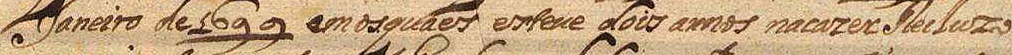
Janeiro de 1699 em os quaes esteue dois annos na cazer Recluzo
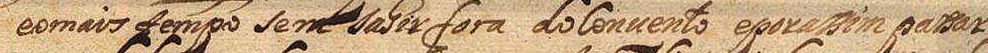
e o mais tempo sem sahir fora do Conuento e por assim passar
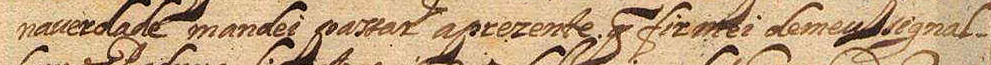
na uerdade mandei passar a prezente q̄ firmei de meu signal
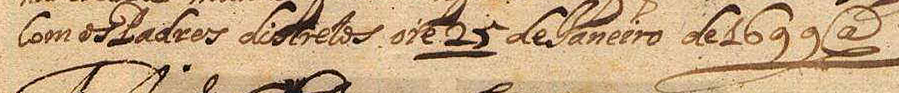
Com os Padres discretos oie 25 de Ianeiro de 1699 ā
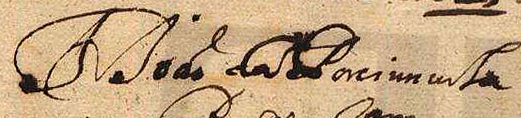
Fr Ioaõ da Porciuncula
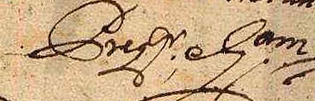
Preg.or, e Ga.m
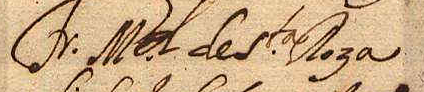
Fr. Me.l de S.ta Roza
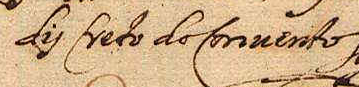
disCreto do Conuento
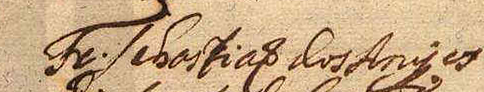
Fr. Sebastiaõ dos Anyos
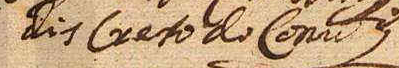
disCreto do Conuto
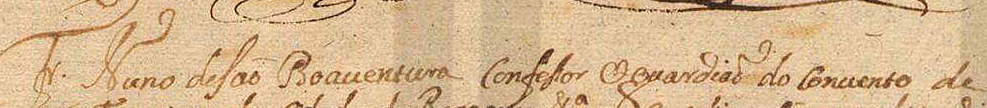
Fr. Nuno de Saõ Boaventura Confessor e guardiaõ do conuento de
